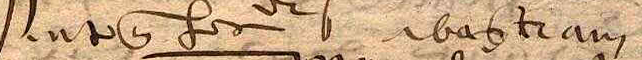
Auto q̄ ho sor sabastiam
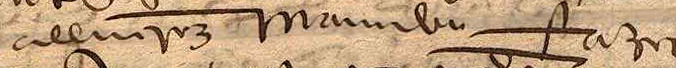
alluerez mamdou fazer
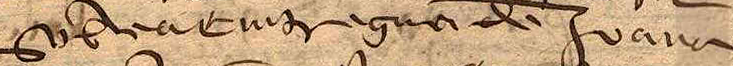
sobre a emtregua de Joana
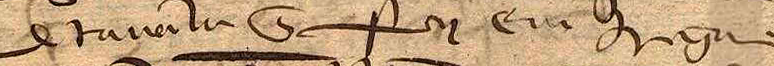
de tauora q̄ foy emtregue
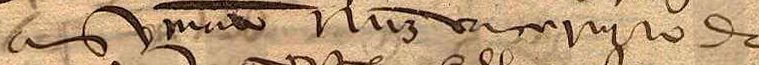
a symão Nūz cacereyro da
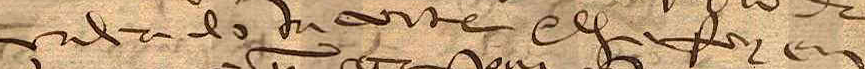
cadea desta corte e lhe foy en
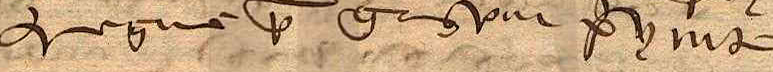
tregue p̄o gaspar pymto
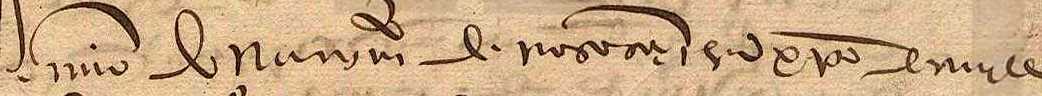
Anno do nacymto de noso s̄or ihū xp̄o de myll
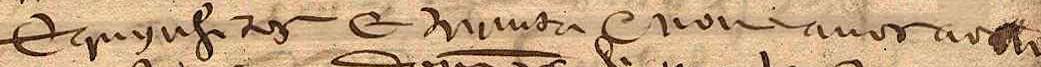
E quynhētos E trymta e noue anos ao ao
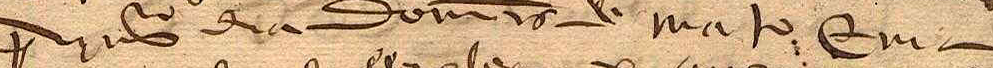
p̄ymro dia do mes de maJo Em a
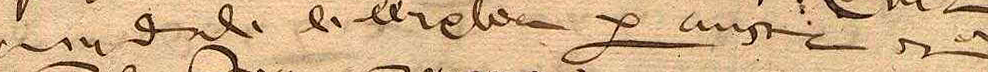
a cydade de llixboa ꝑamte o sor
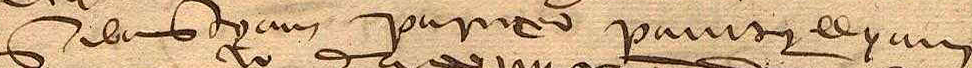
Sabastyam pareceo pamtyllyam
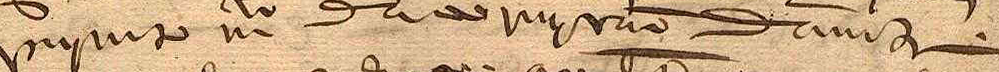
pymto mro da coreyção damtre
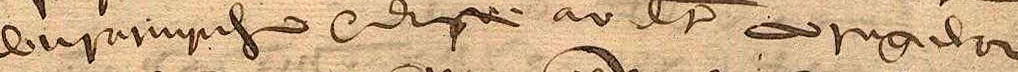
douramynho e dise ao dt̄o coregedor
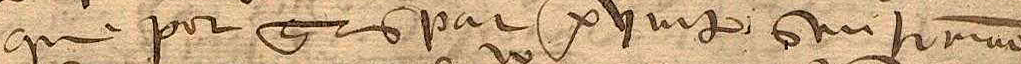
que por gaspar pymto seu Jrmão
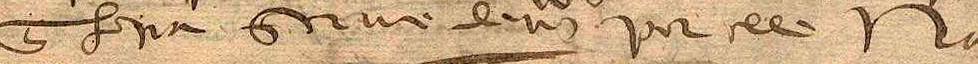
q̄ hora serue de mro por elle Na
